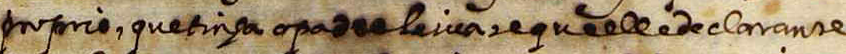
proprio, que tinha o padre Leiua, e quē elle declarante
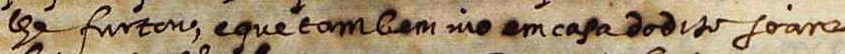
lhe furtou, e que tambem uio em casa do dito Joam
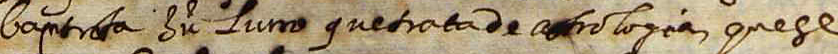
baptista hū Liuro que trata de astrologia, que se
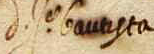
d. J.o bautista
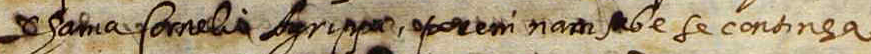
chama Cornelio Agrippa, porem nam sabe se continha
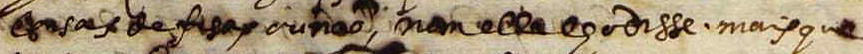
cousas defesas ou naõ, nem elle lho disse. mais que
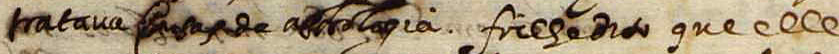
trataua Cousas de astrologia. foilhe dito que elle
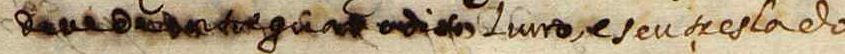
deue de entreguar o dito Liuro, e seu treslado
